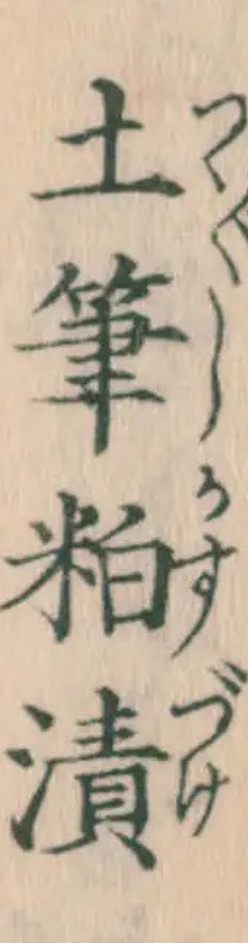土筆粕漬
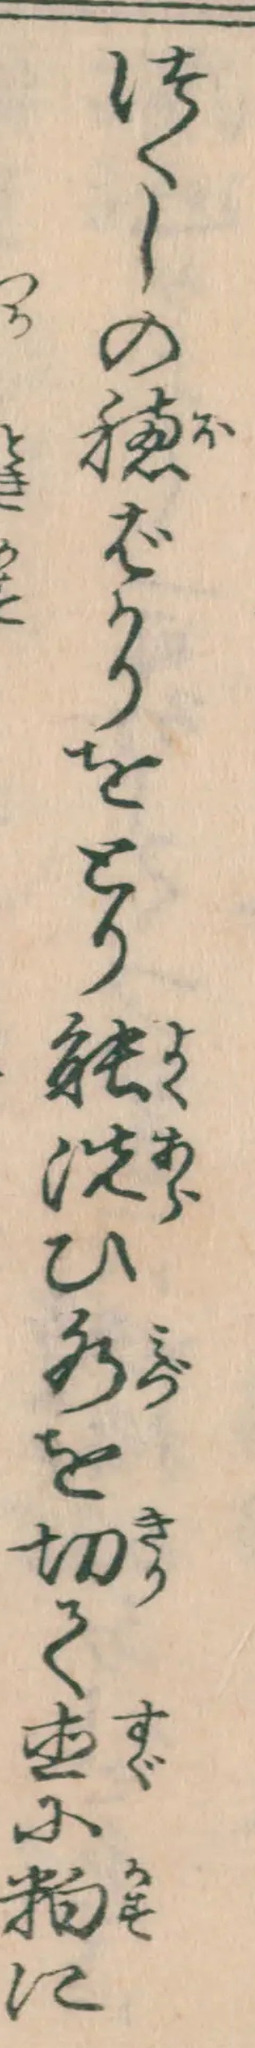つくしの穂ばかりをとり能洗ひ水を切て直に粕に
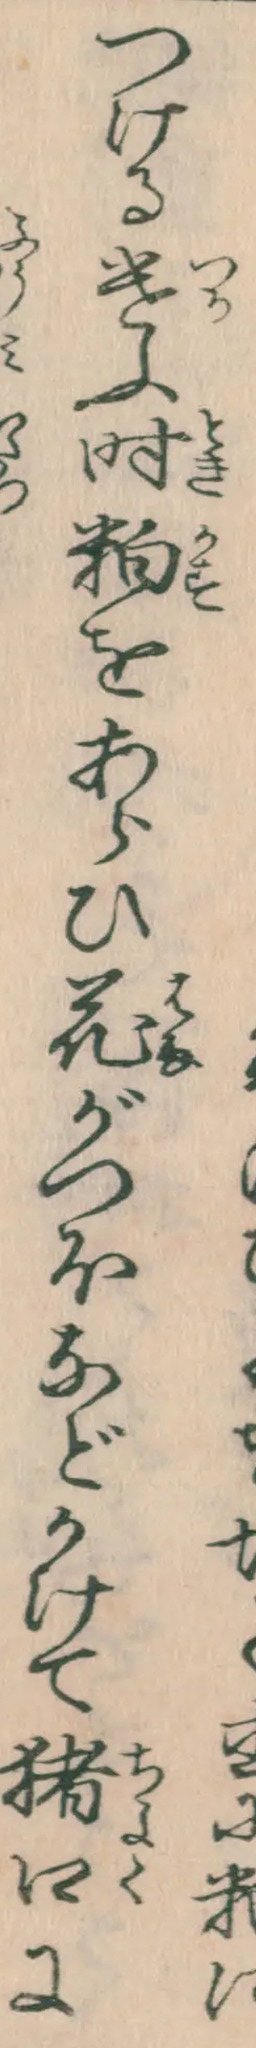つける遣ふ時粕をあらひ花がつほなどかけて猪口に
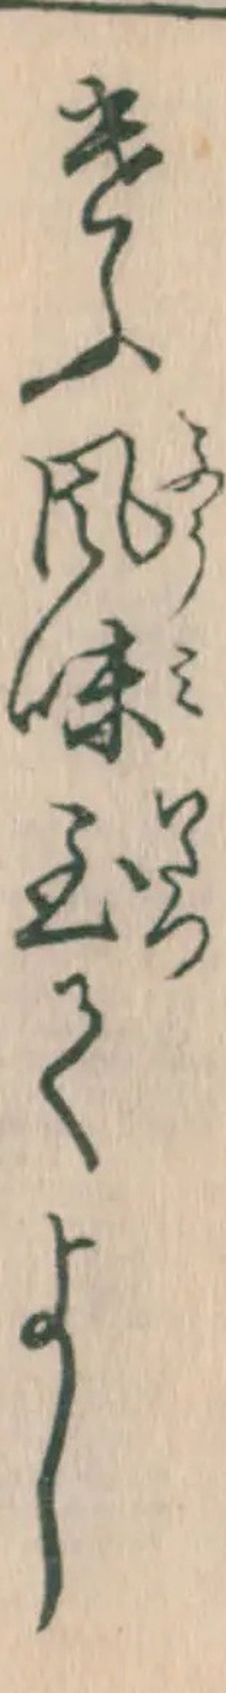けふ風味至てよし
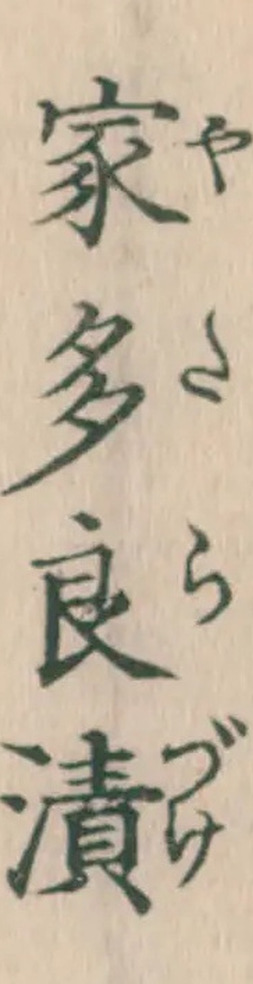家多良漬
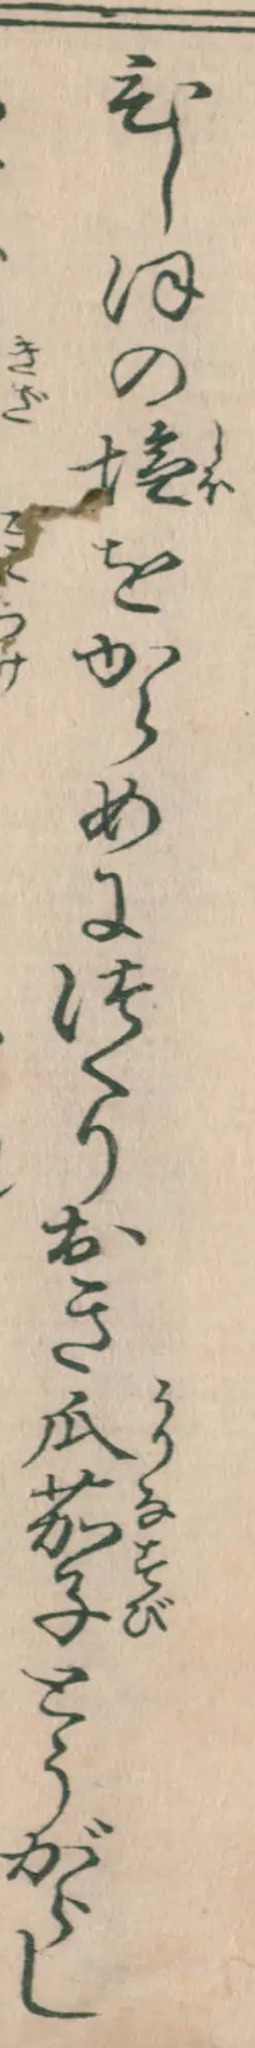ひしほの塩をからめにつくりおき瓜茄子とうがらし
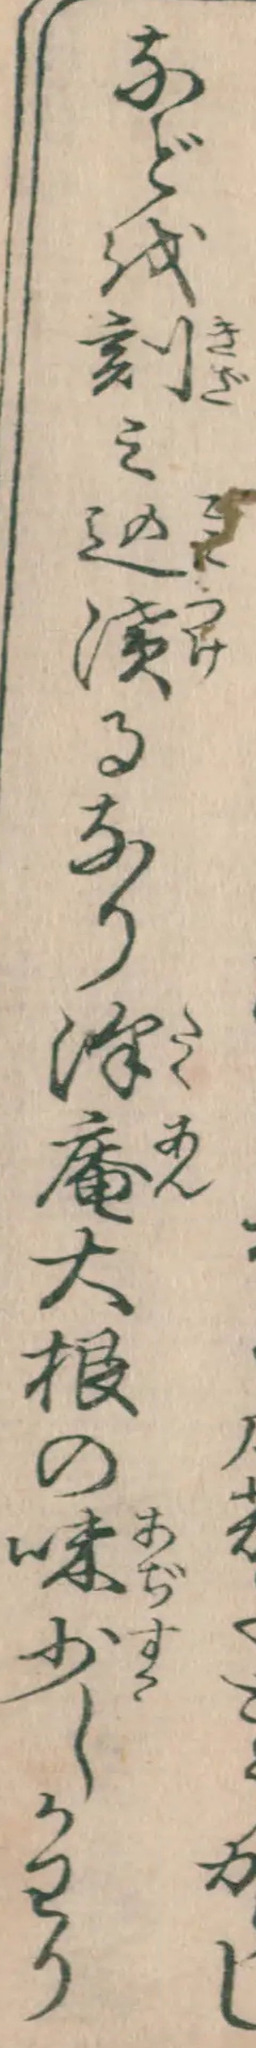などを刻み込漬るなり沢庵大根の味少しかわり

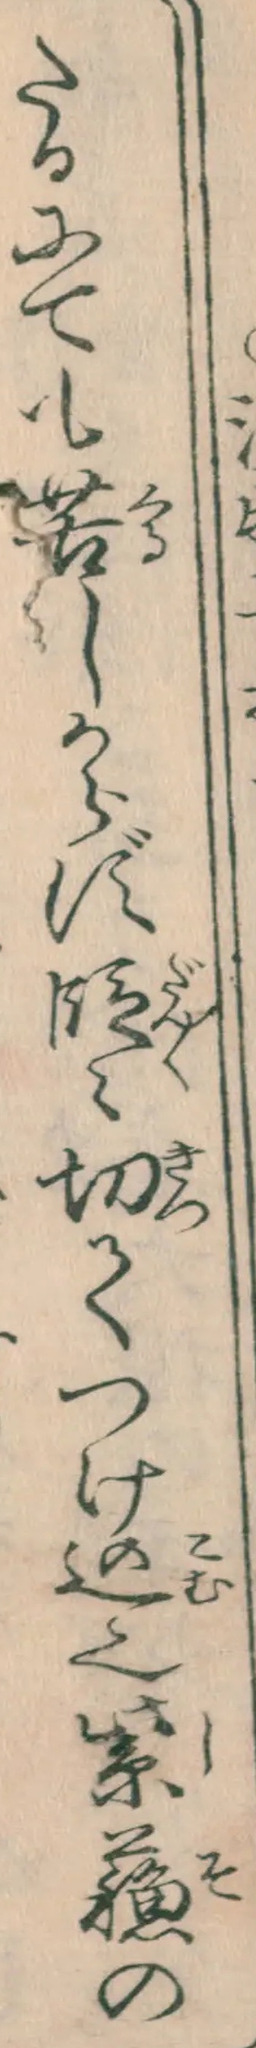たるにても苦しからず段々切てつけ込也紫蘇の
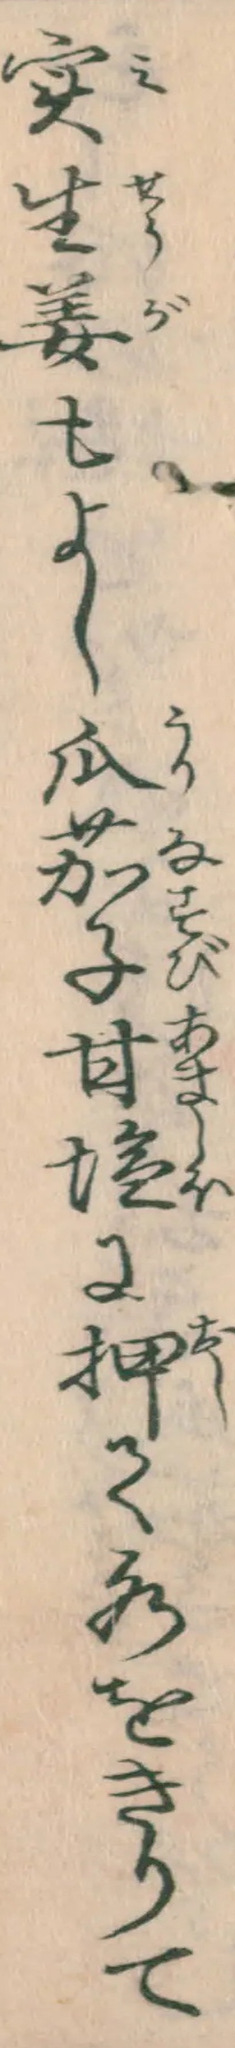実生姜もよし瓜茄子甘塩に押て水をきりて
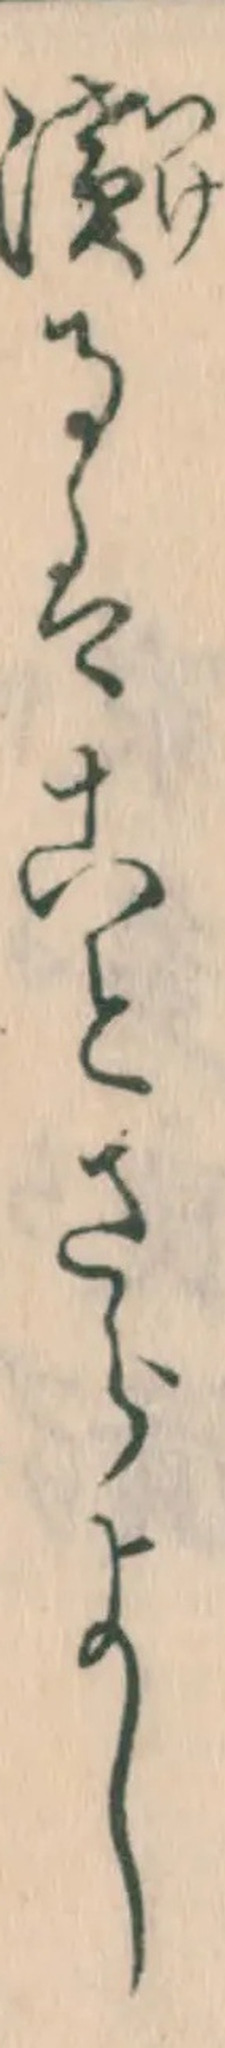漬るはことさらよし
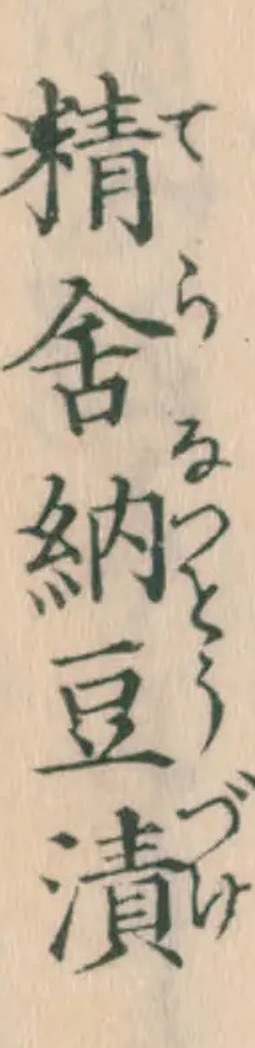精舎納豆漬
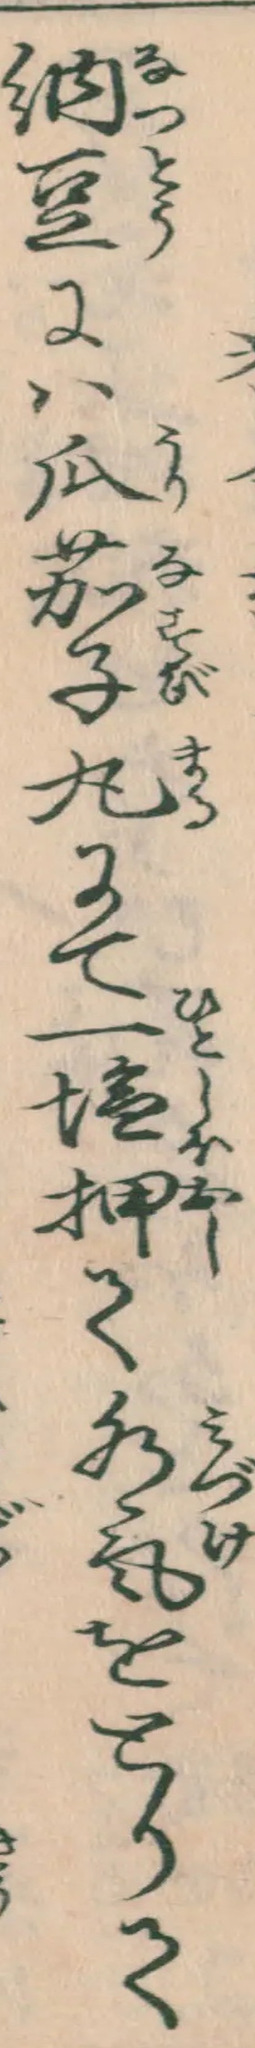納豆には瓜茄子丸にて一塩押て水気をとりて
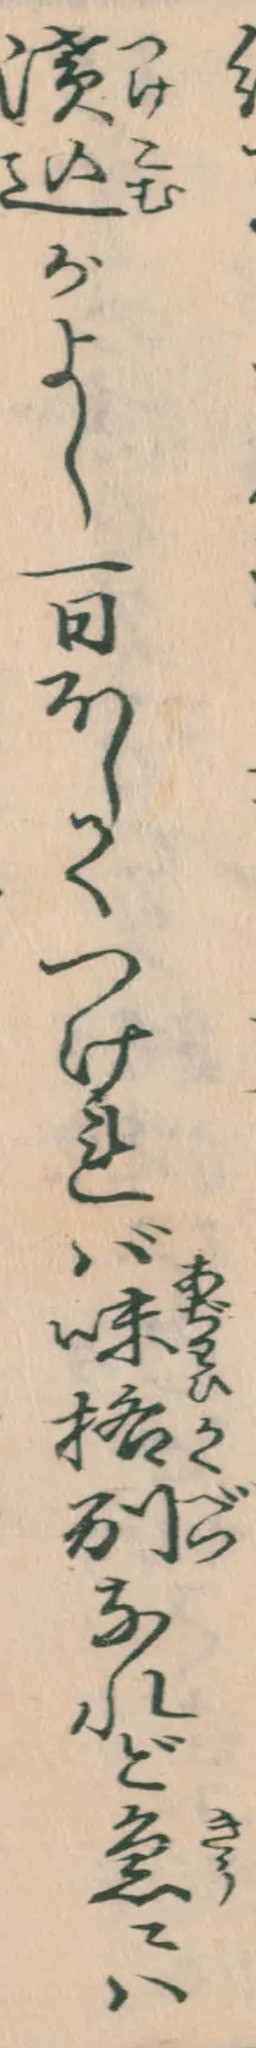漬込がよし一日ほしてつければ味格別なれど急には
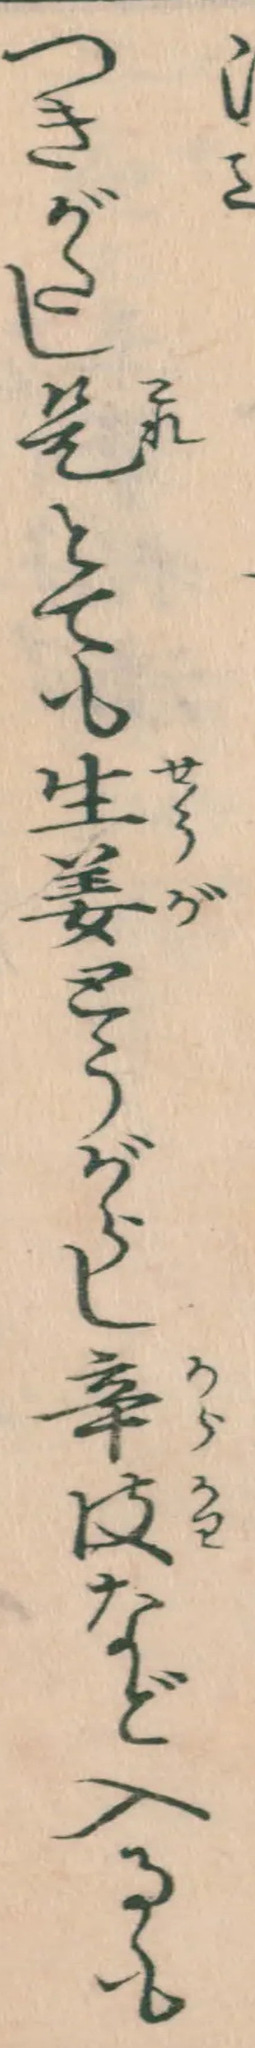つきがたし是とても生姜とうがらし辛皮など入るも
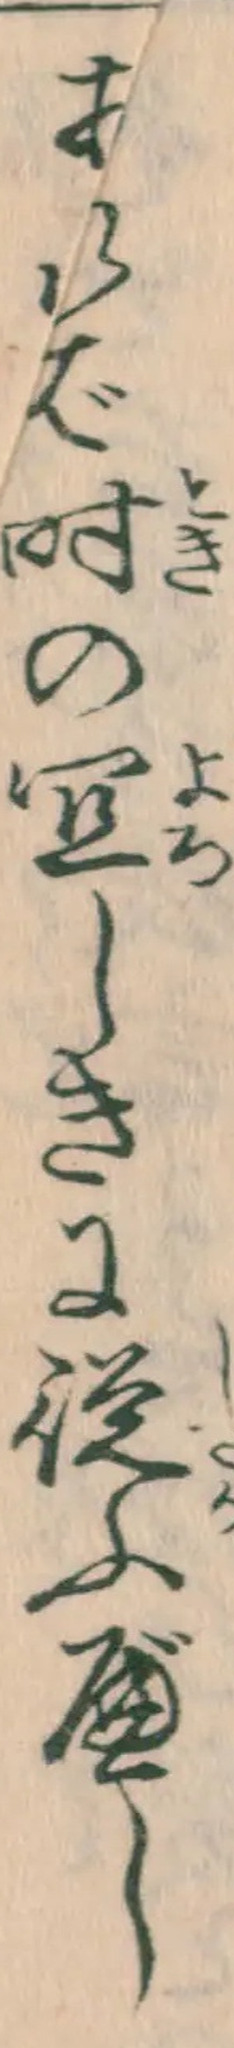あれば時の宜しきに従ふべし
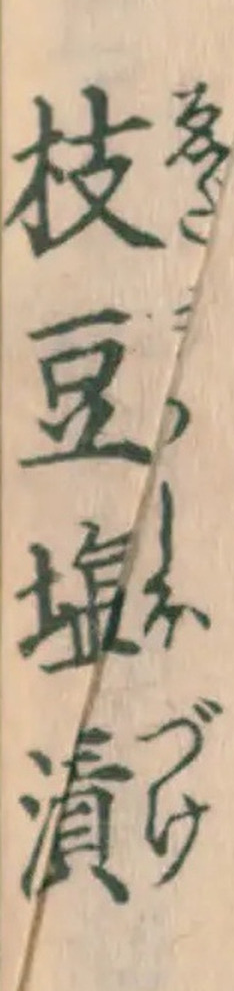枝豆塩漬
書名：四季漬物鹽嘉言
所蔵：国立国会図書館 National Diet Library, JAPAN
